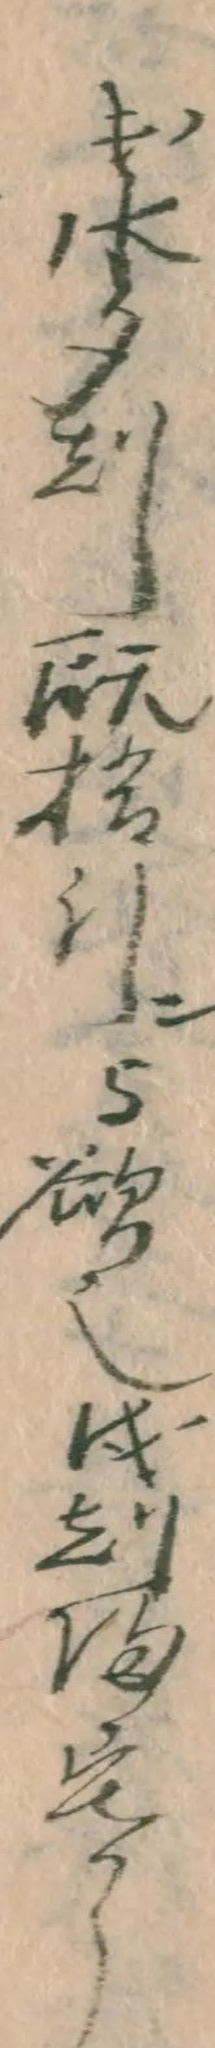出水夕刻既橋引にと欲也戌刻帰宅了
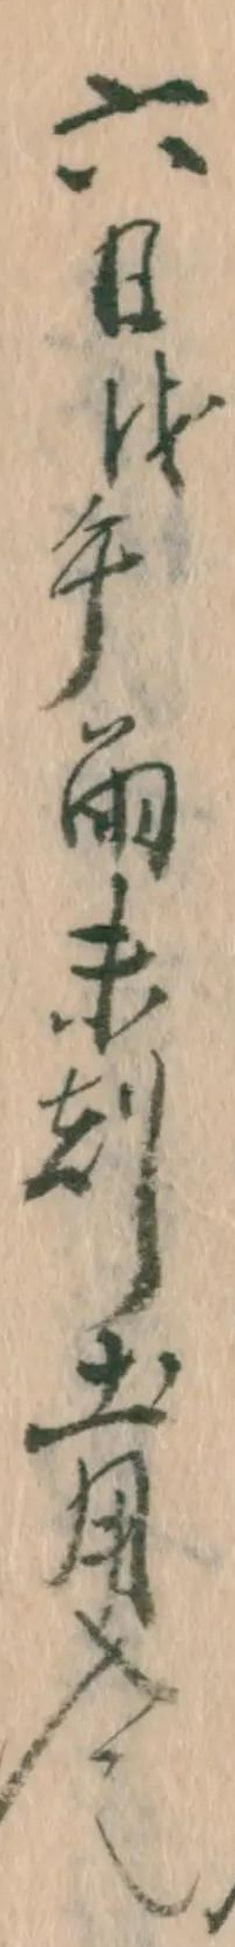六月戊午雨未刻土用入也
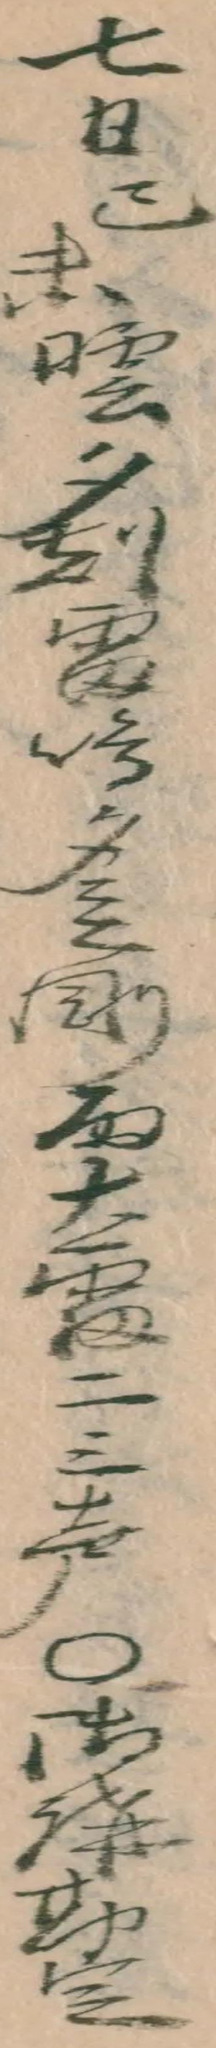七日己未曇夕刻雷鳴夕立即雨大雷二三声○御講勘定
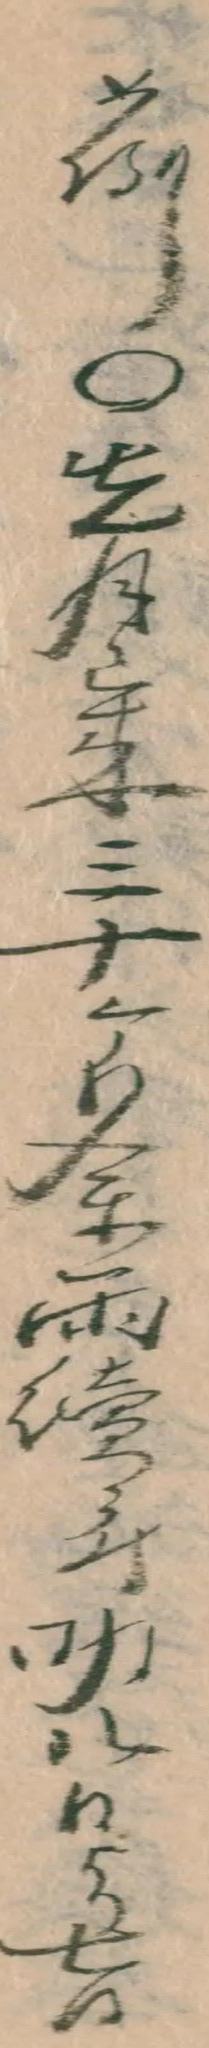如例○先月已来三十ケ日余雨續ニ付明八日より七日
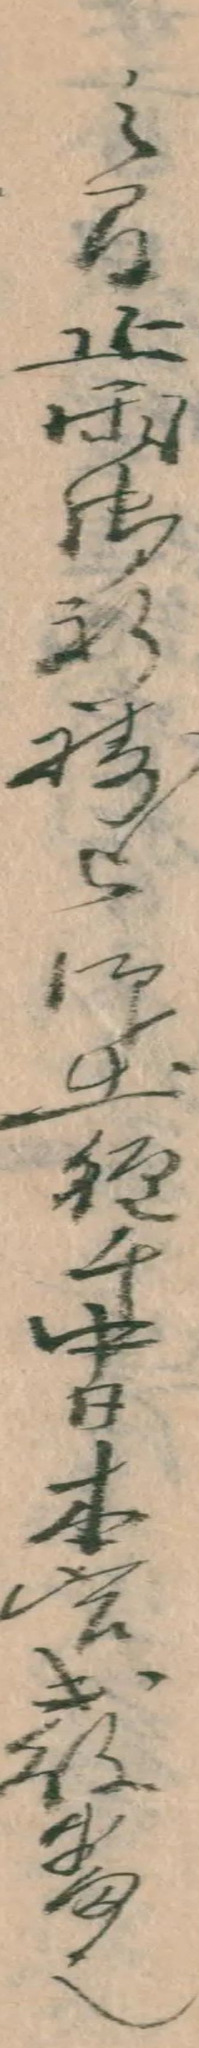之間止雨御祈祷被仰出経千中日本宮出役番也
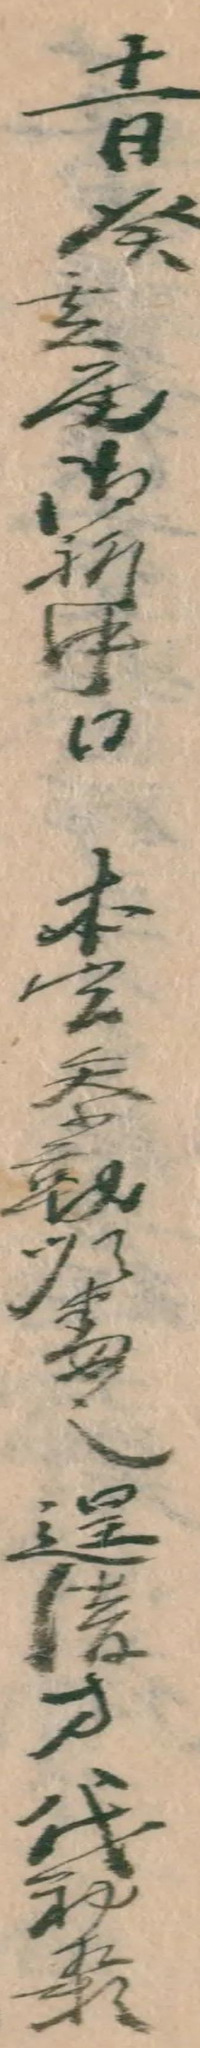十一日癸亥雨御祈中日本宮参勤順番也逞清方へ代初相頼了
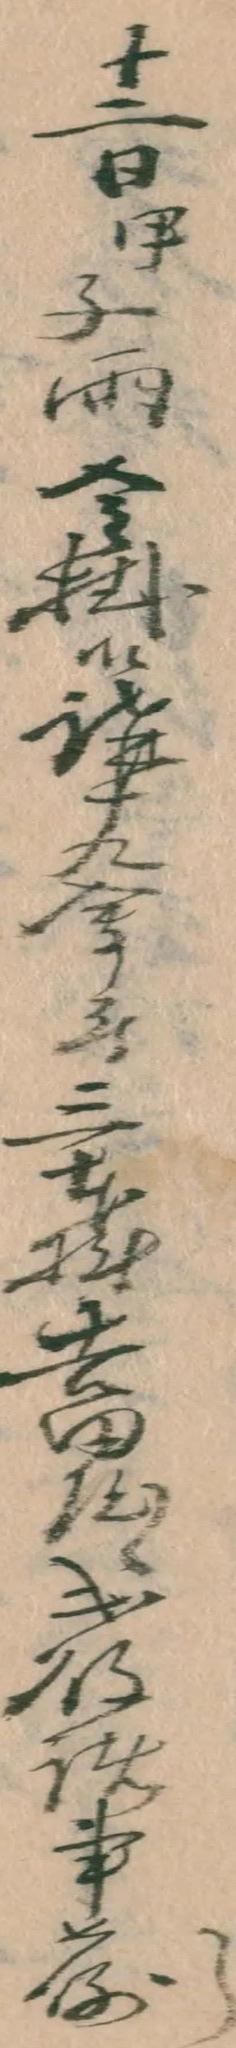十二日甲子雨金掛御講十九會ニ付三本樹吉田屋へ出役諸事如例
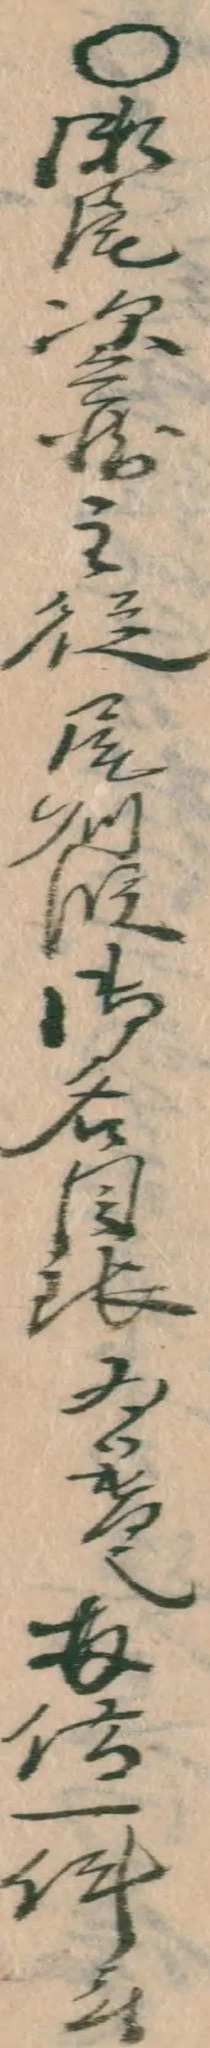○瀬尾次兵衛主従尾州段御名目銀為御書也拝借一件ニ付
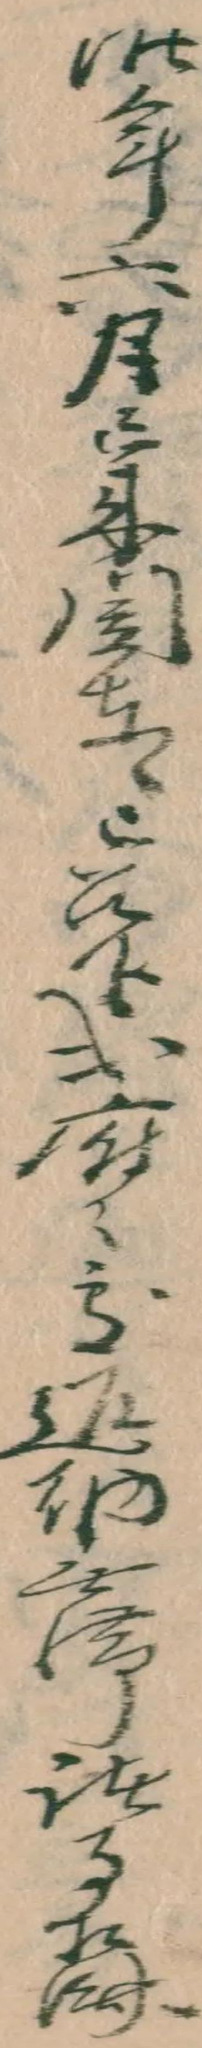昨年六月已来関東へ被召下出府之處返納無滞諸事相済
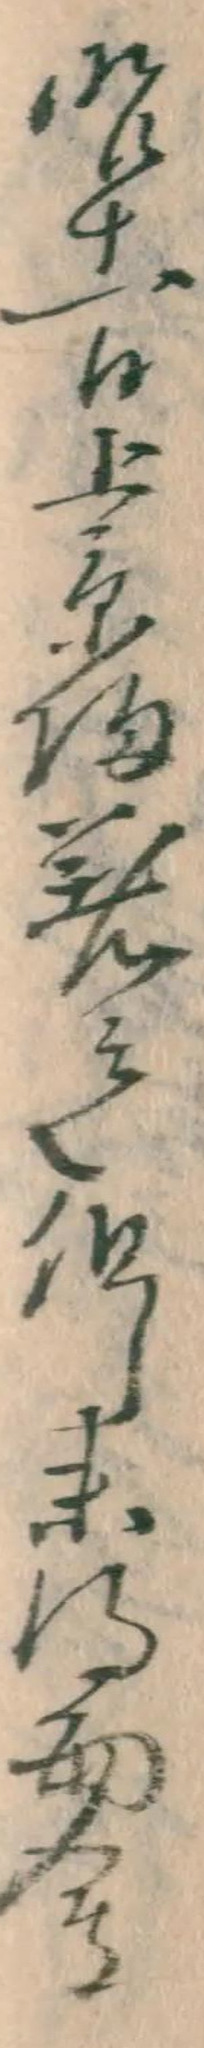昨十一日上京帰着云々但し未得面會
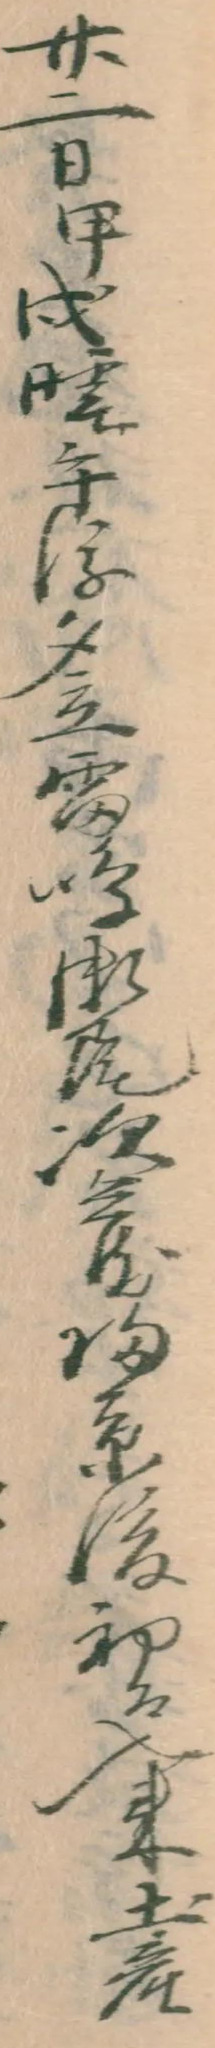廿二日甲戌曇午後夕立雷鳴瀬尾次兵衛帰京後初而入来土産
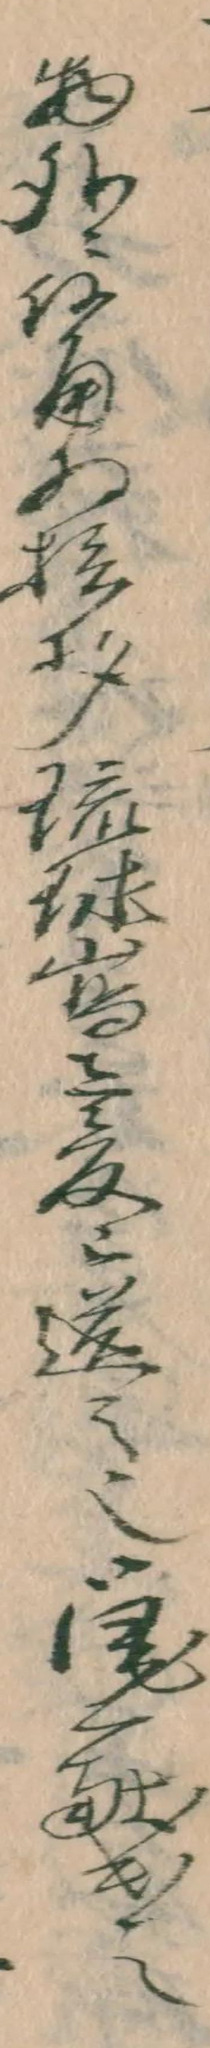物外ニ何角為挨拶琉球嶌壱反被送之御酒一献出之
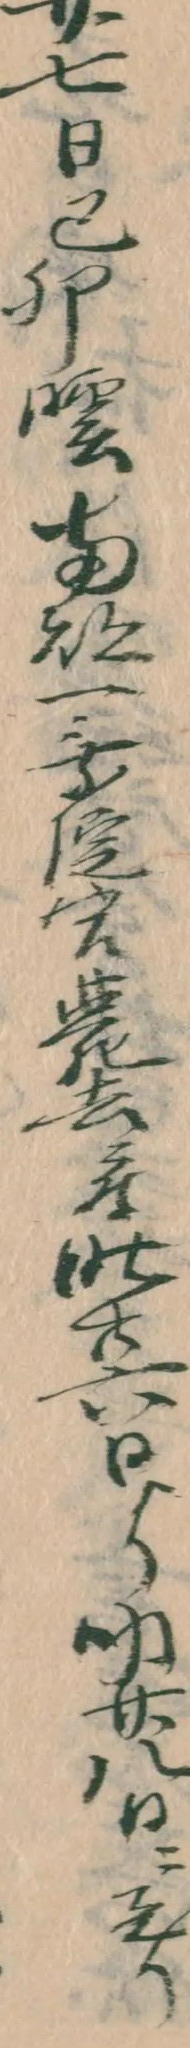廿七日己卯曇南都一乗院宮薨去二付昨廿六日より明廿八日二至り
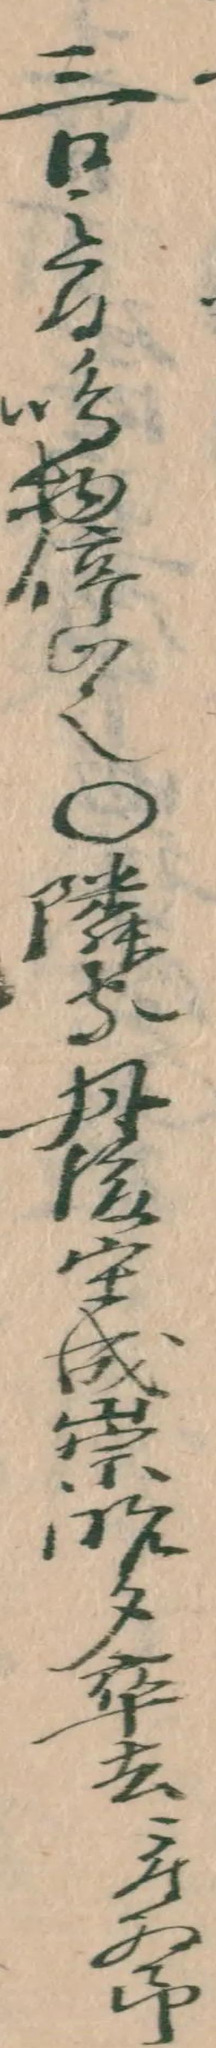三日之間鳴物停止也○隣家丹後守成崇昨夕卒去ニ付為弔
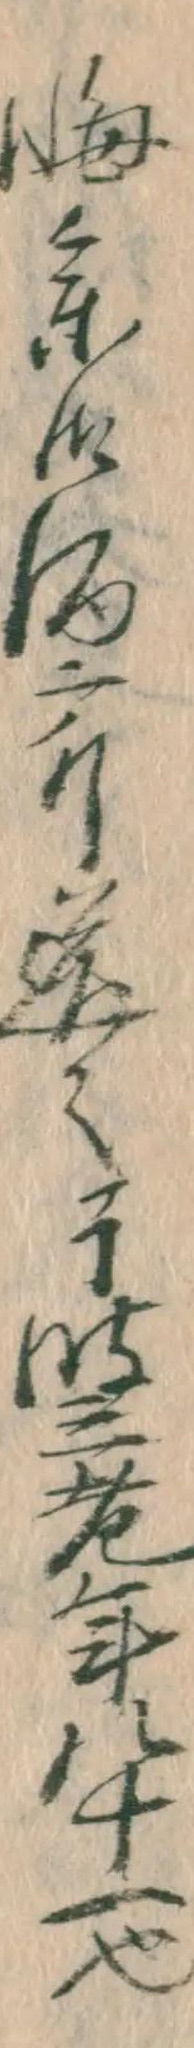悔参御酒二升送也于時三老年八十一也
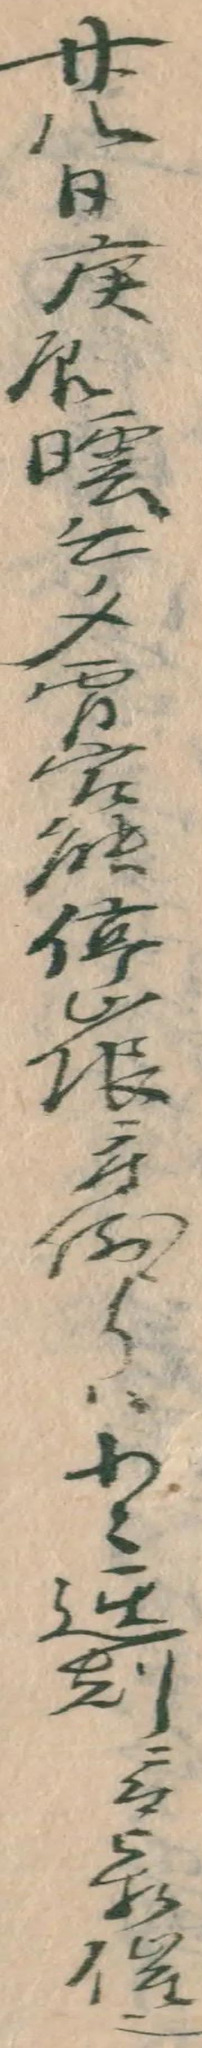廿八日庚辰曇今夕宵宮能停止限ニ付例よりハ少々遅刻ニ而被相催也
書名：賀茂社記録. 第67冊
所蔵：国立国会図書館 National Diet Library, JAPAN
